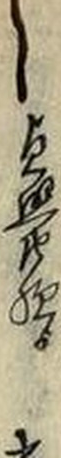貞照院様ゟ
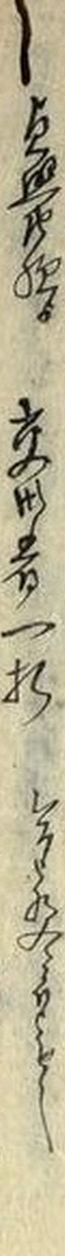貞照院様ゟ交御肴一折今日為入候ニ付被進之
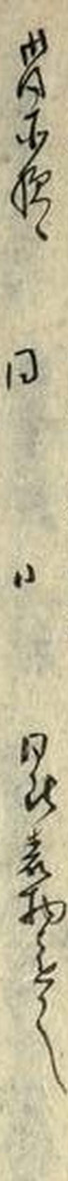御同所様へ同同同断表物被進之
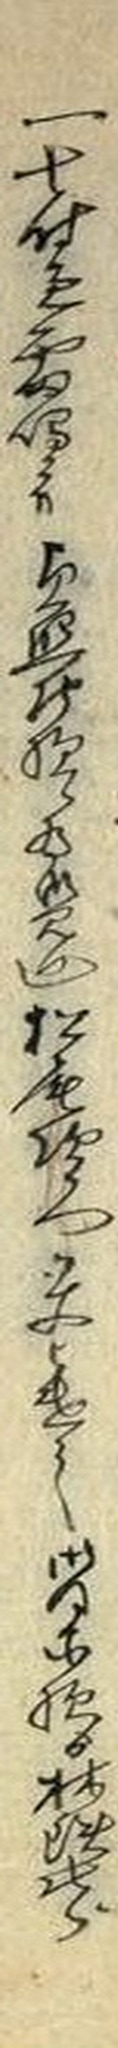一七時過雷鳴ニ付貞照院様被為御見廻松尾次右衛門御使被遣之御同所様ゟ林鉄次郎
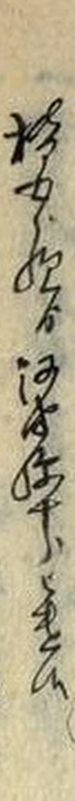揩五郎様ゟ河津孫十郎被遣候
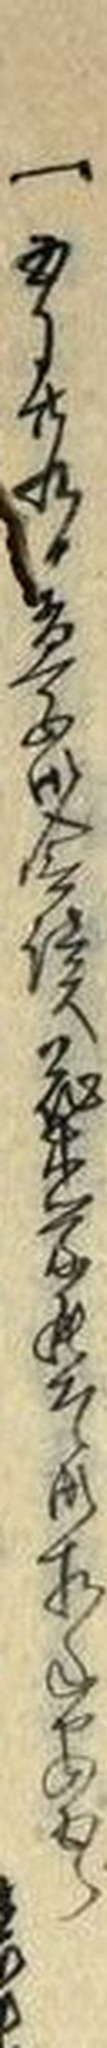一五月廿九日孟子御会読花木栄罷出候御相手安五郎

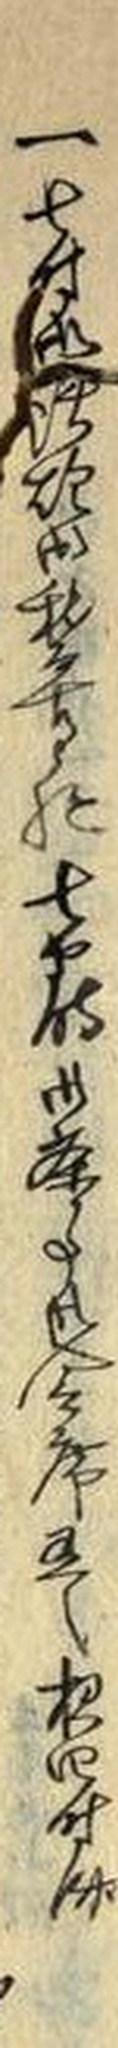一七時御鉄炮御稽古被遊七半時御斎事御会席有之夜四時済
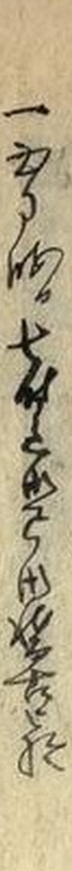一五月晦日七時過御弓御稽古被遊
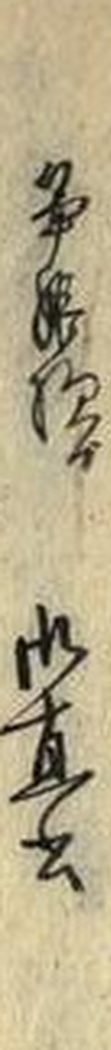箏姫様ゟ御直書
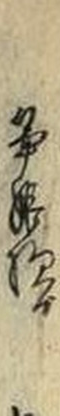箏姫様へ
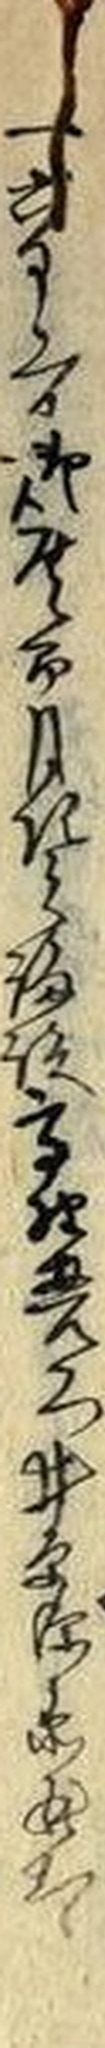一六月二日御座之間月次之講談高野惣左衛門井原源兵衛罷出候
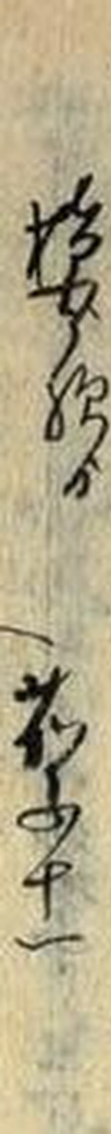揩五郎様ゟ茄子十一
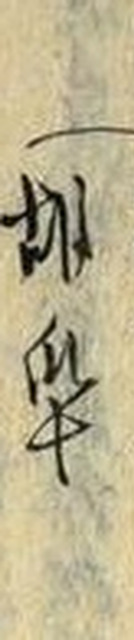胡瓜十
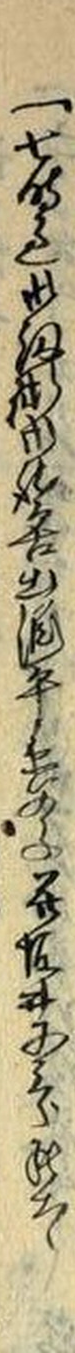一七時過御釼術御稽古出渕平兵衛父子并坂井又三郎罷出候
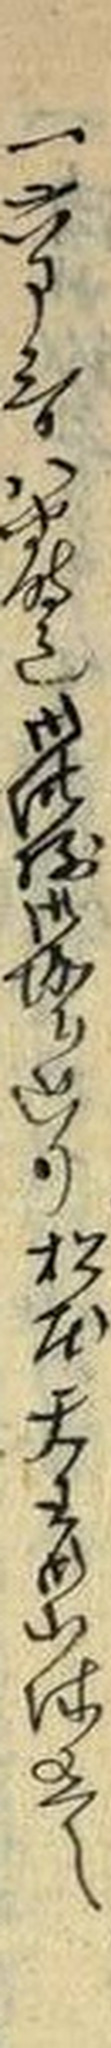一六月三日八半過御供揃御城下廻り松本天主御小休有之
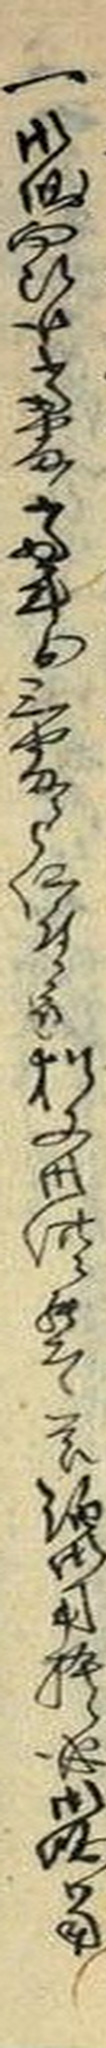一御側向頭取当番当年ゟ三番ニ被仰付候ニ付猶又御供ニ罷出候節泊御用捨之儀御側御用
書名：少傅日録抄（斉承付側向頭取日記、在国）
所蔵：福井県文書館 Fukui Prefectural Archives
